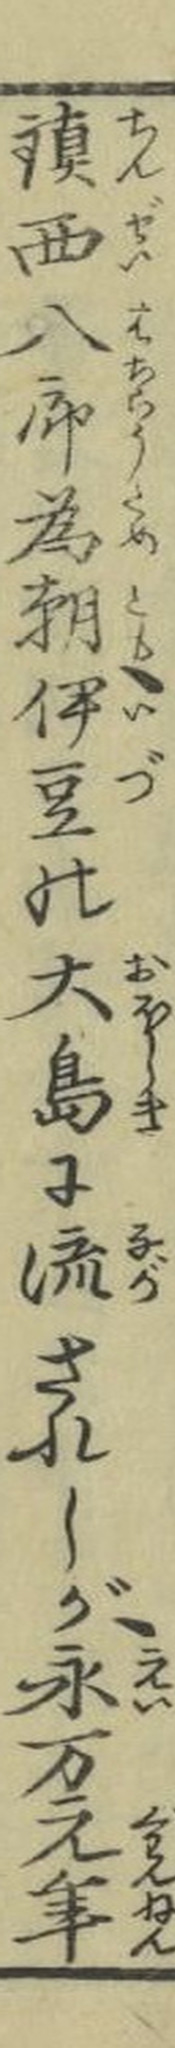鎮西八郎為朝、伊豆の大島に流されしが、永万元年
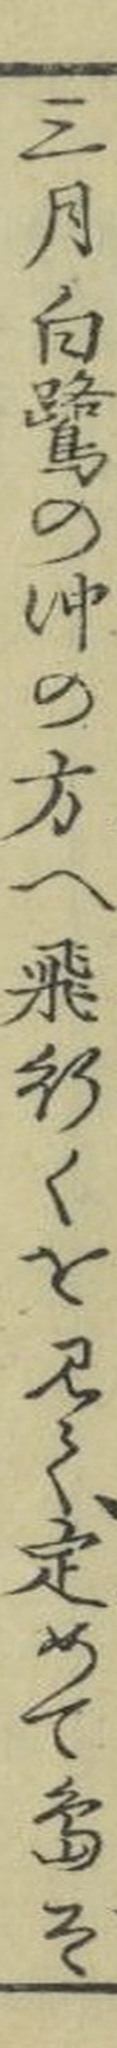三月、白鷺の沖の方へ飛行くを見て、定めて島ぞ
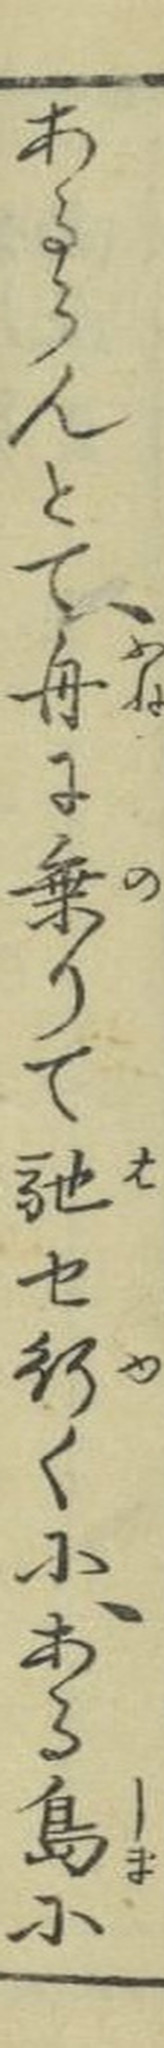あるらんとて、舟に乗りて馳せ行くに、ある島に
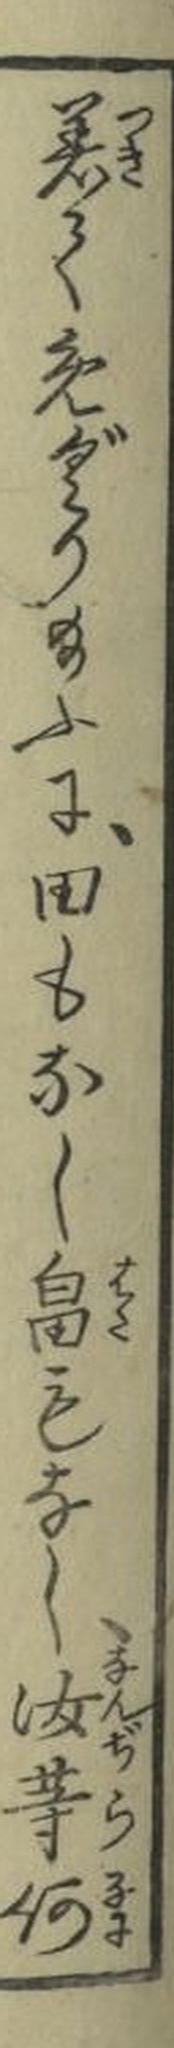着てめぐり給ふに、田もなし畠もなし、汝等何
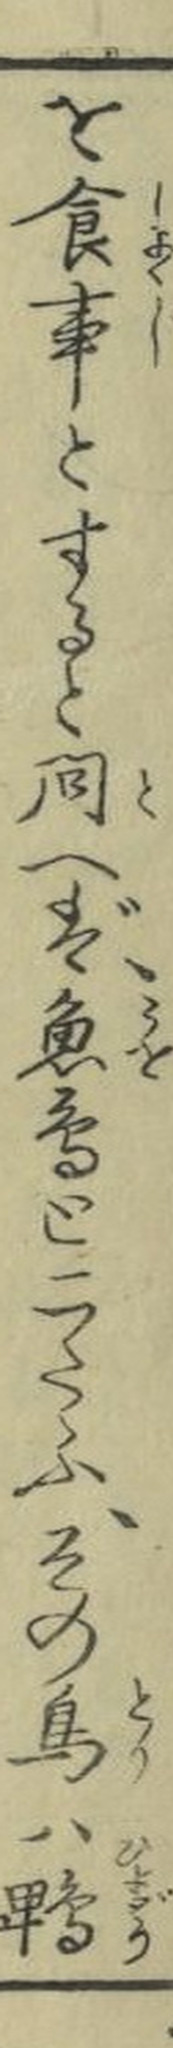を食事とすると問へば、魚鳥とこたふ、その鳥は鵯
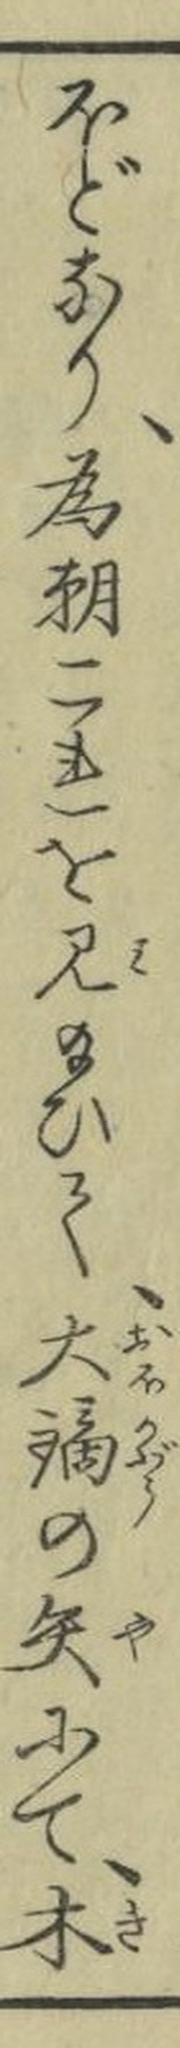ほどなり、為朝これを見給ひて、大鏑の矢にて、木
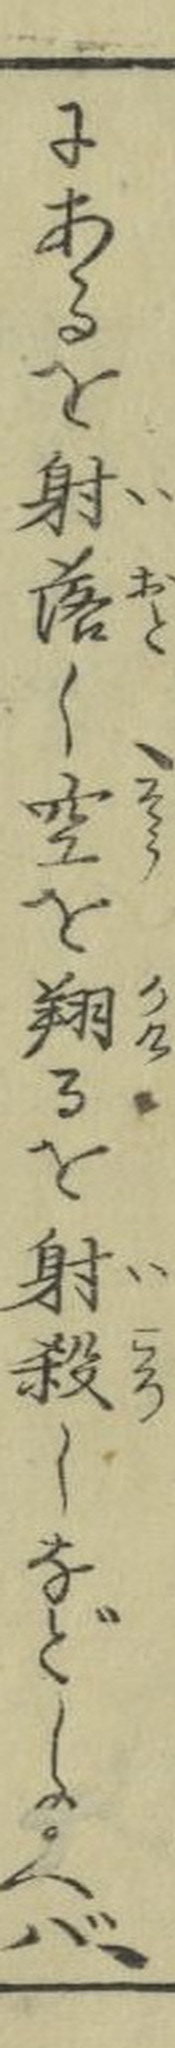にあるを射落し、空を翔るを射殺しなどし給へば、
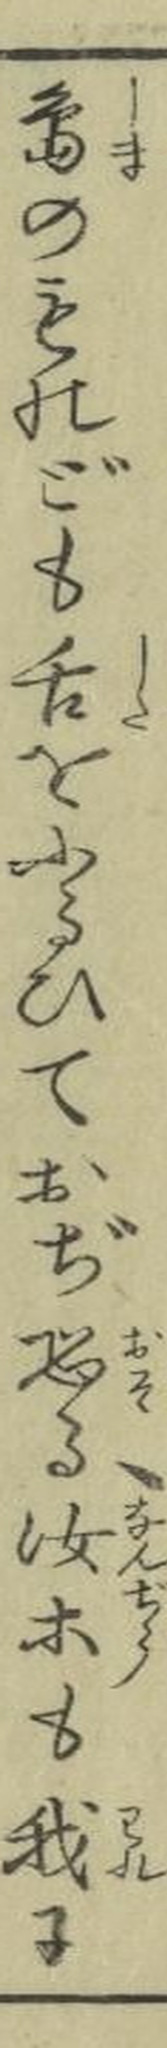島のものども舌をふるひておぢ恐る、汝等も我に
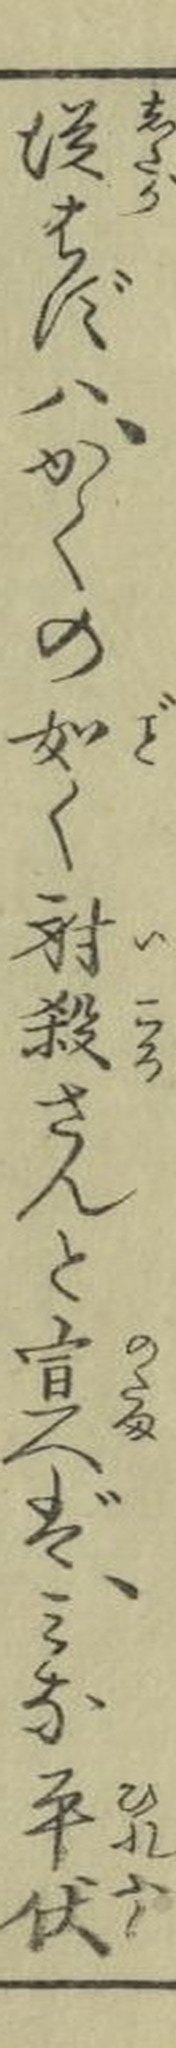従はずは、かくの如く射殺さんと宣へば、みな平伏
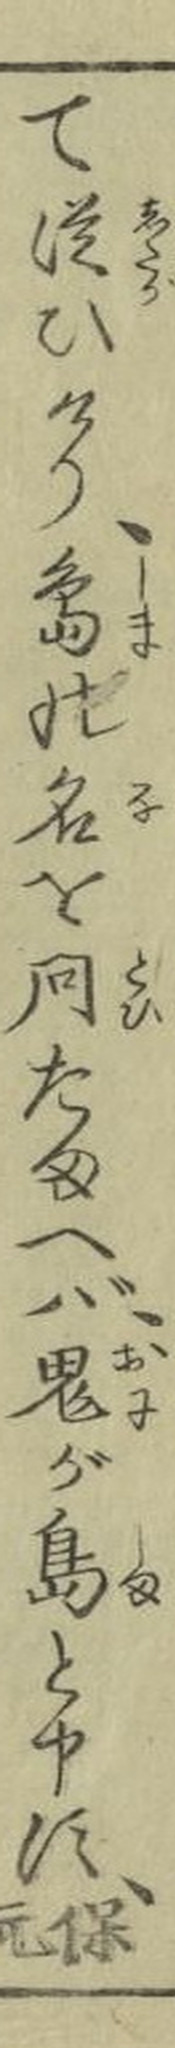て従ひけり、島の名を問たまへば、鬼が島と申す、保元
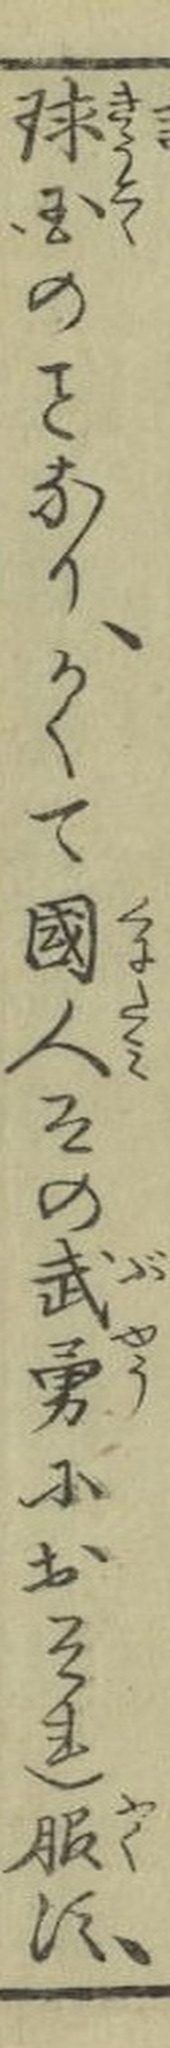球国のことなり、かくて国人その武勇におそれ服す、

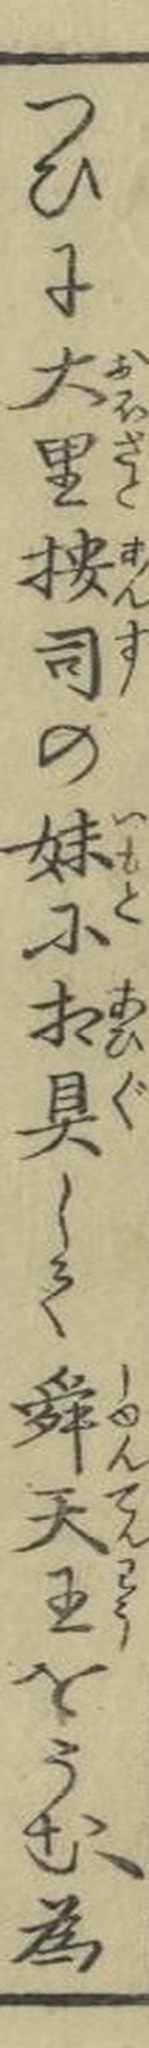つひに大里按司の妹に相具して舜天王をうむ、為
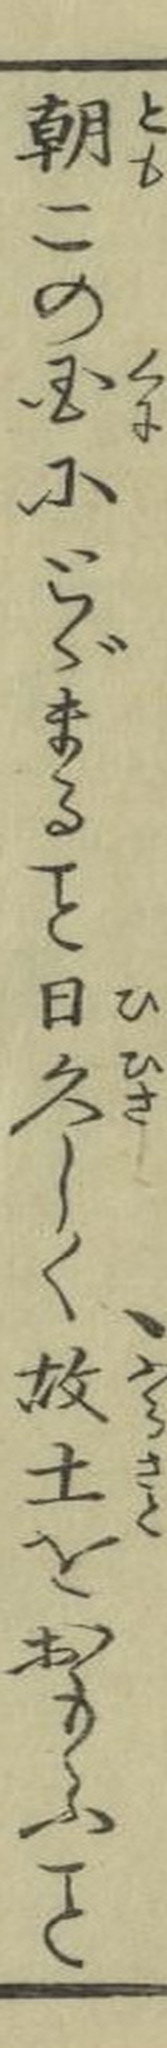朝この国にとゞまること日久しく、故土をおもふこと
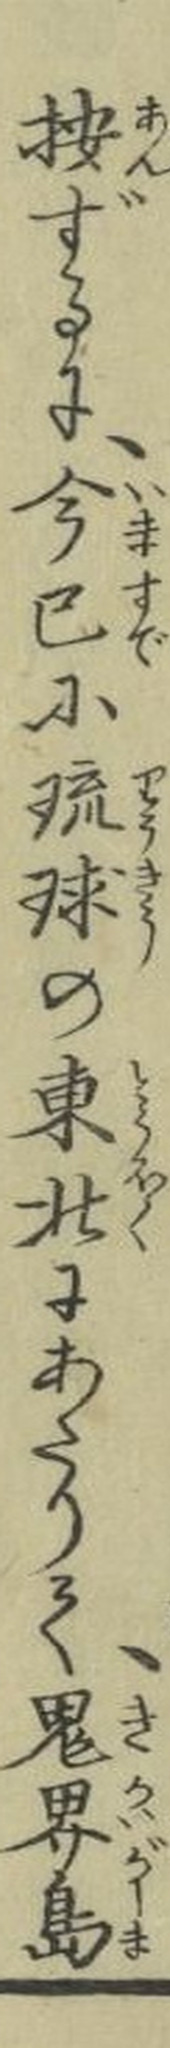按ずるに、今已に琉球の東北にあたりて、鬼界島
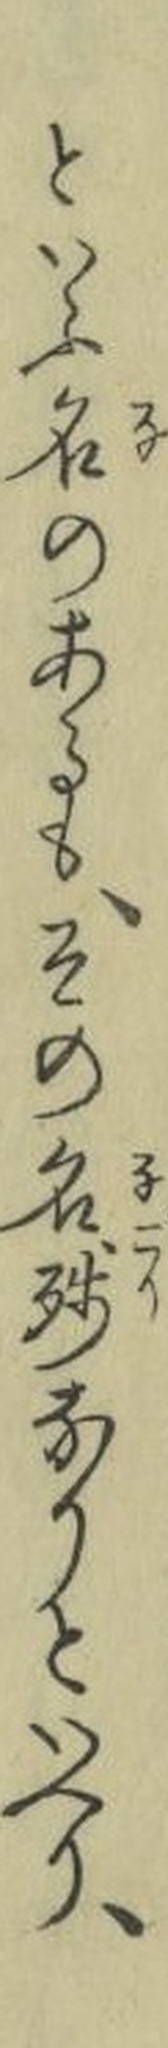といふ名のあるも、その名残なりといへり、
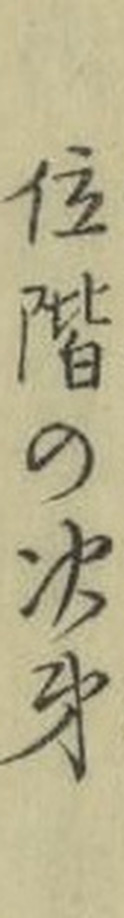位階の次第
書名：琉球入貢紀略
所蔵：University of the Ryukyus Library
